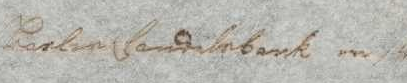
Basler Handelsbank in
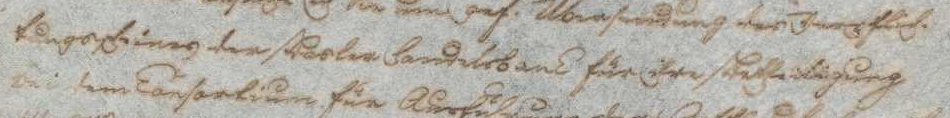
tungsscheines der Basler Handelsbank für ihre Betheiligung
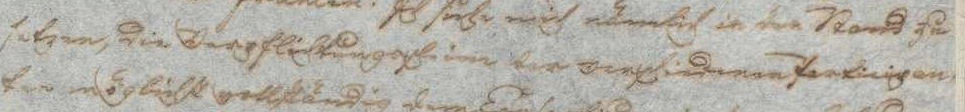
setzen, die Verpflichtungsscheine der verschiedenen Participan-
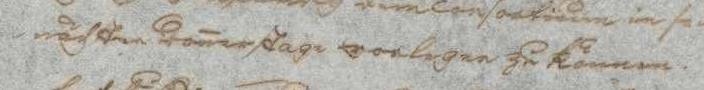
nächsten Donnerstag vorlegen zu können.
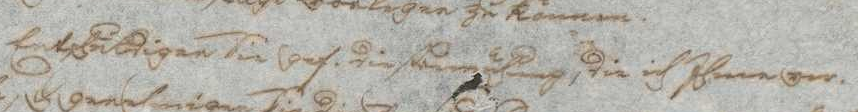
Entschuldigen Sie gef. die Bemühungen, die ich Ihnen ver-
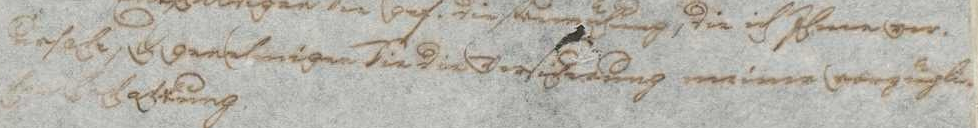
ursache, & genehmigen Sie die Versicherung meiner vorzügli-
